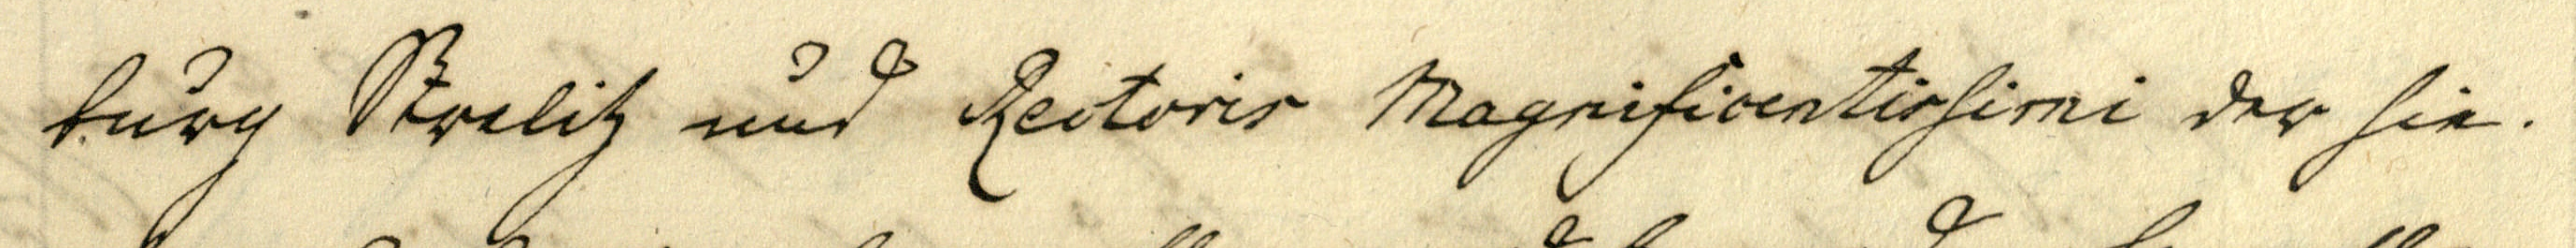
burg Strelitz und Rectoris Magnificentissimi der hie-
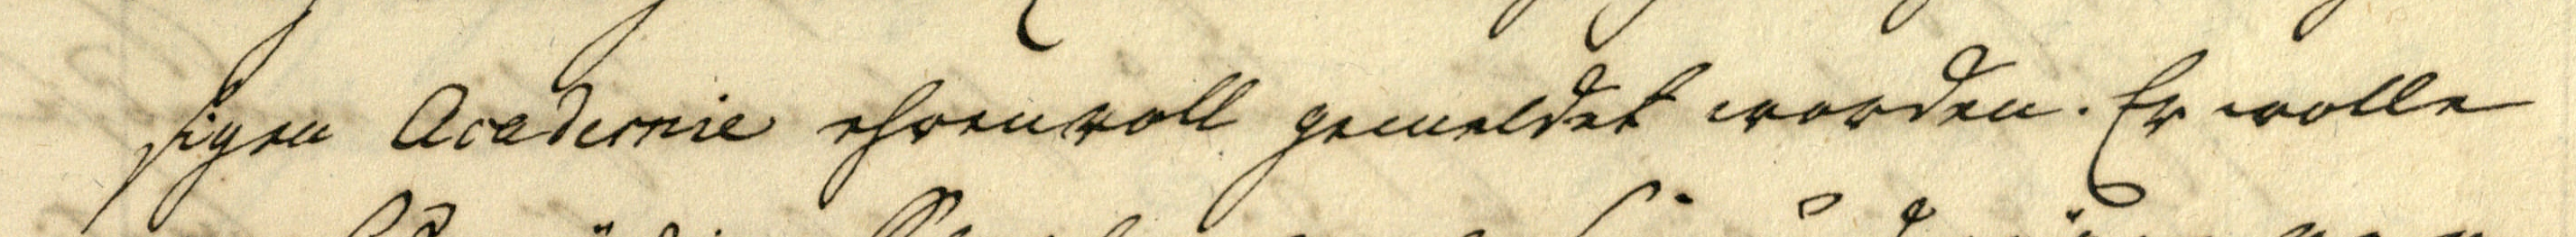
sigen Academie ehrenvoll gemeldet worden. Er wolle
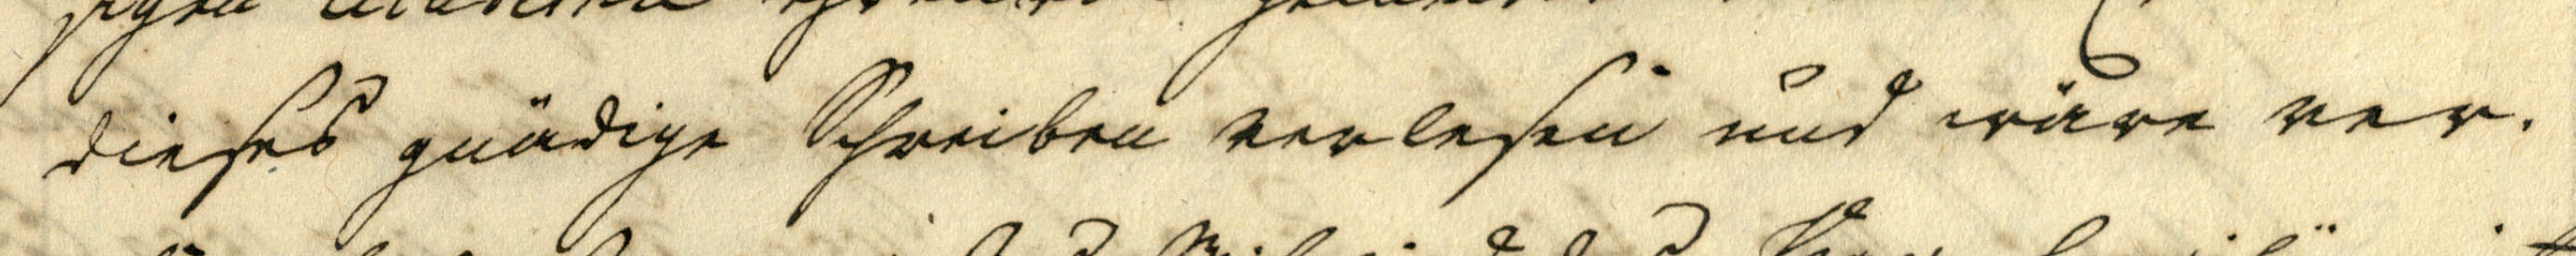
dieses gnädige Schreiben verlesen und wäre ver-
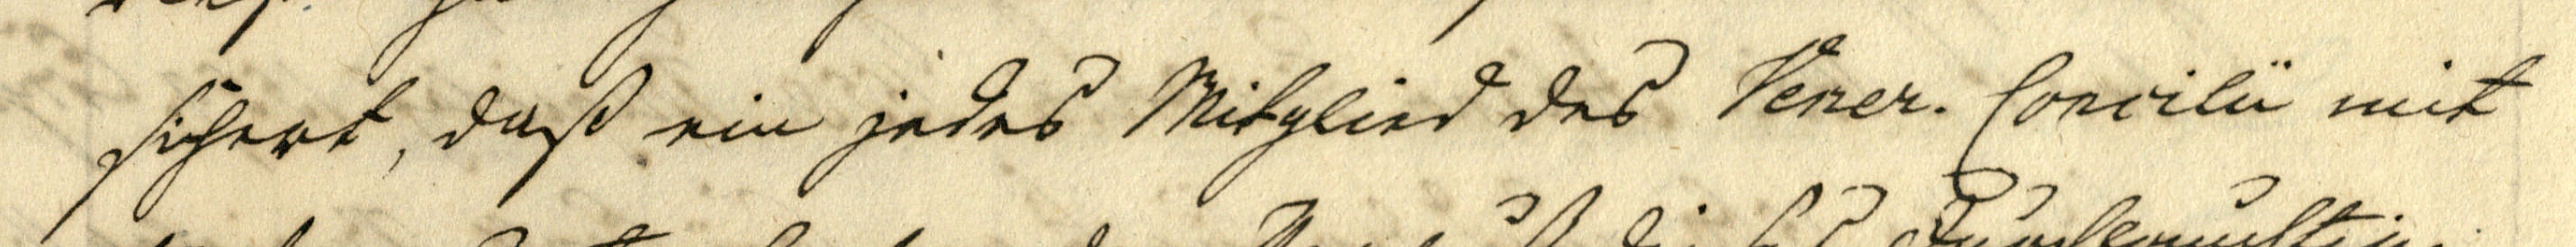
sichert, daß ein jedes Mitglied des Vener. Concilii mit
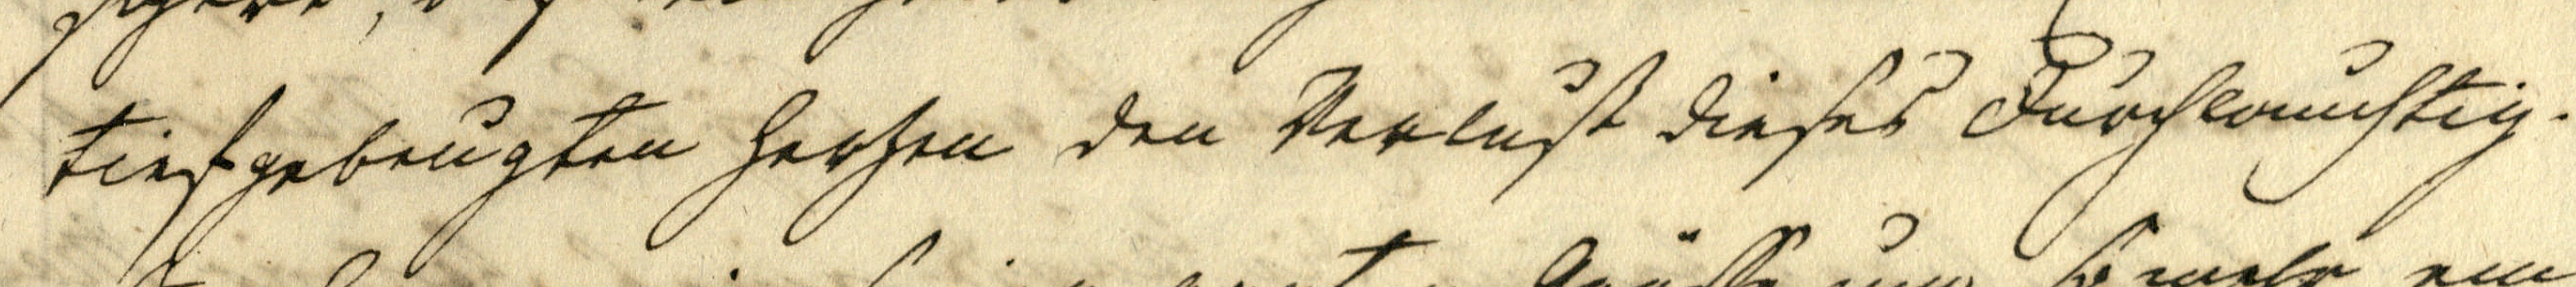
tief gebeugten Herzen den Verlust dieses durchlauchtig-
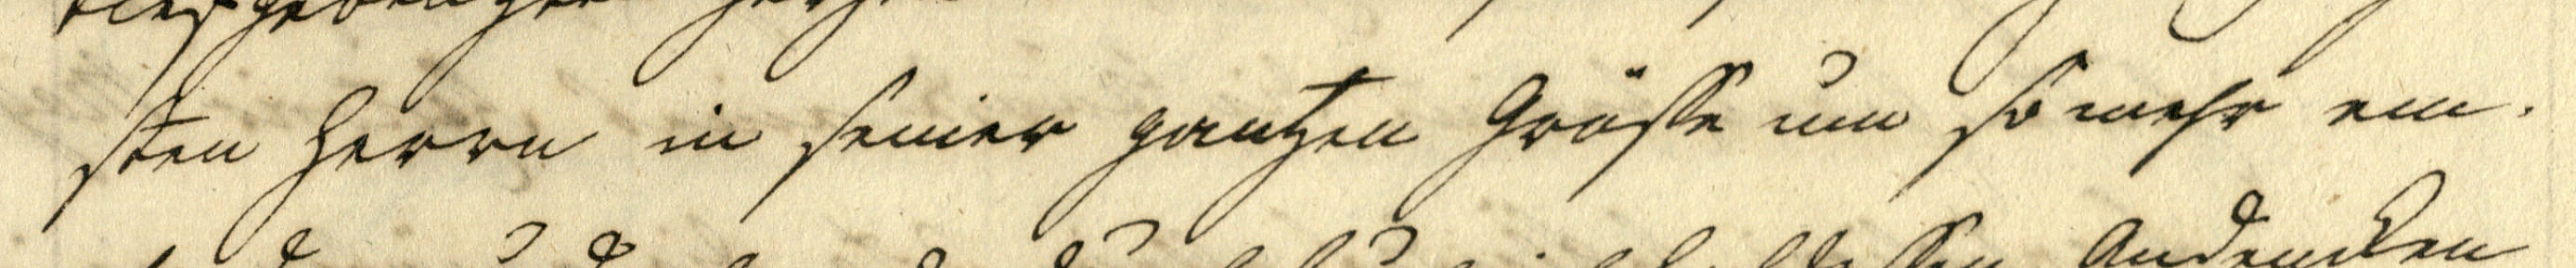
sten Herrn in seiner gantzen Grösse um so mehr em-
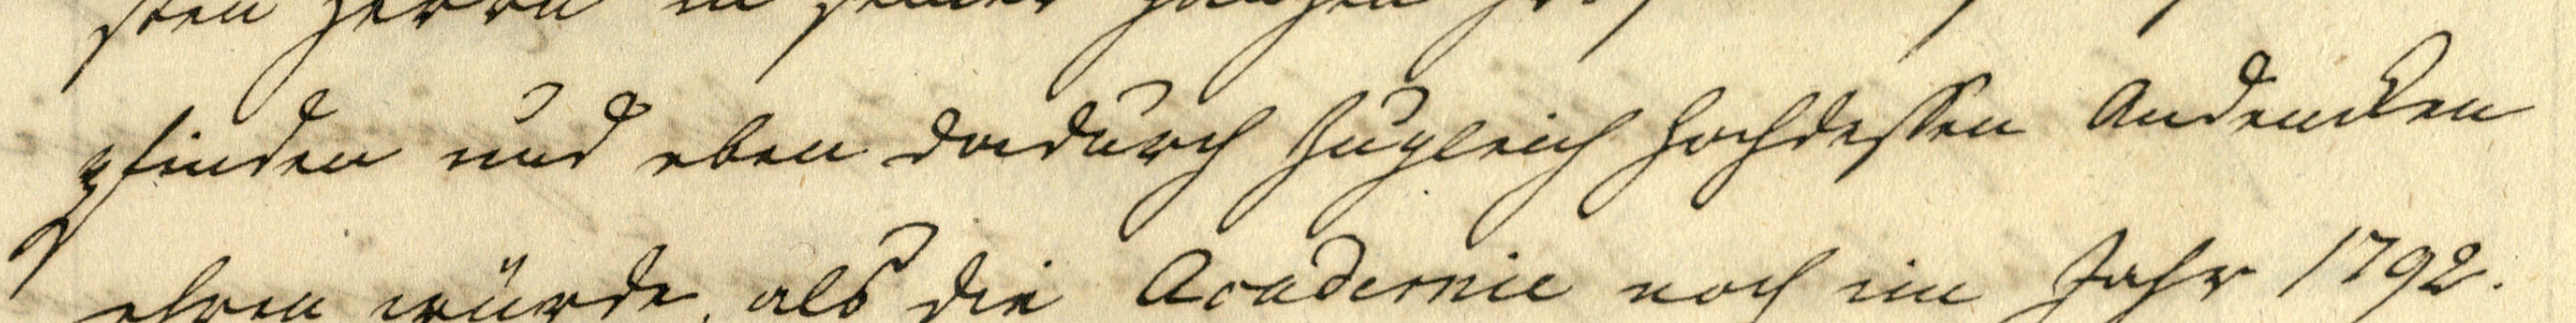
pfinden und eben dadurch zugleich hochdessen Andenken
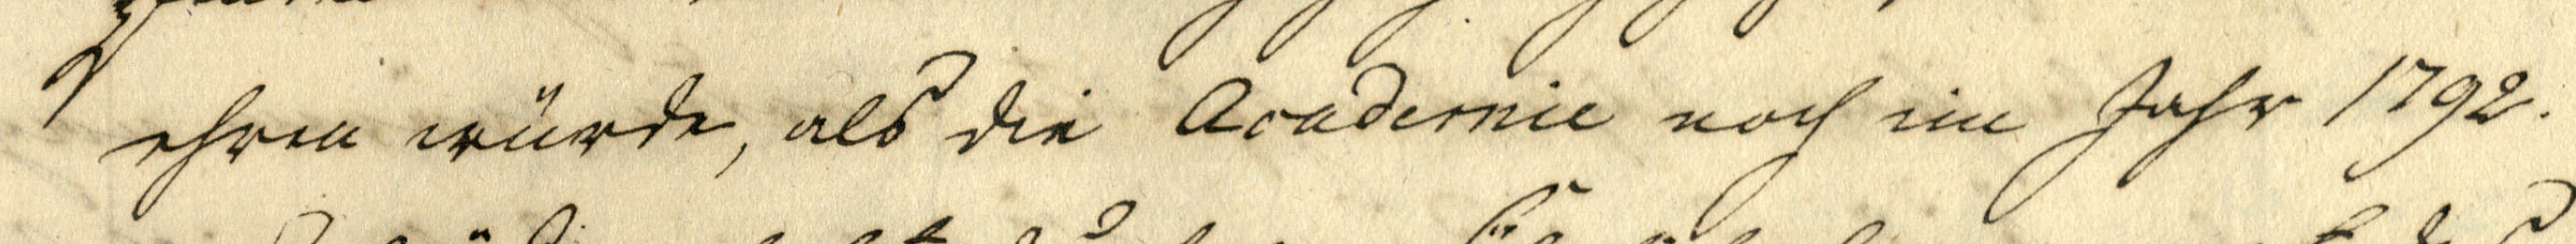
ehren würde, als die Academie noch im jahr 1792
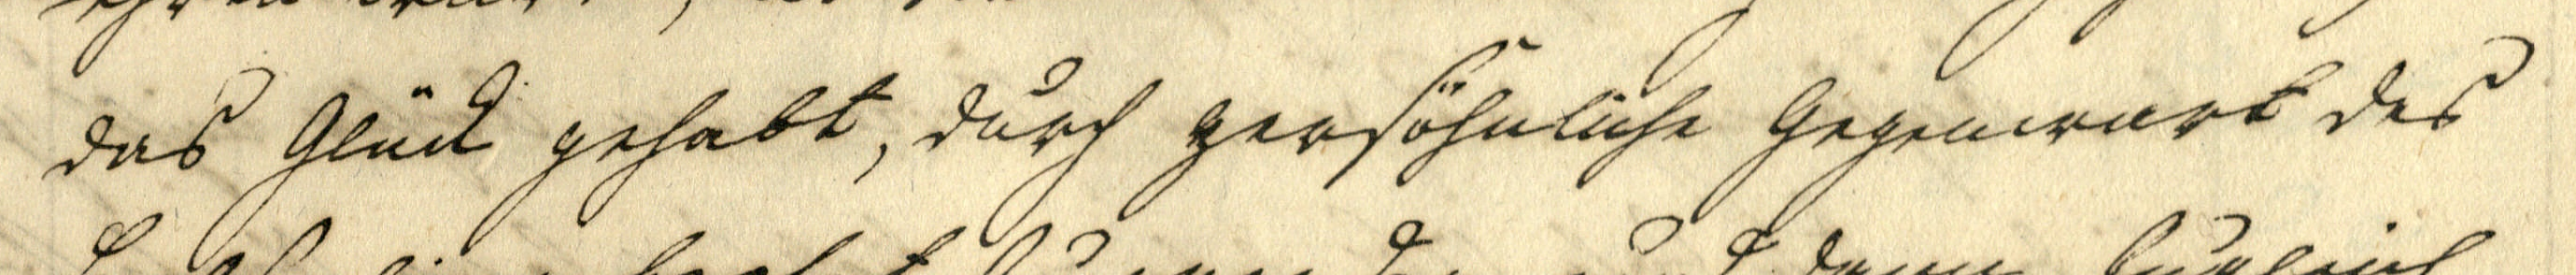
das Glück gehabt, durch persöhnliche Gegenwart des
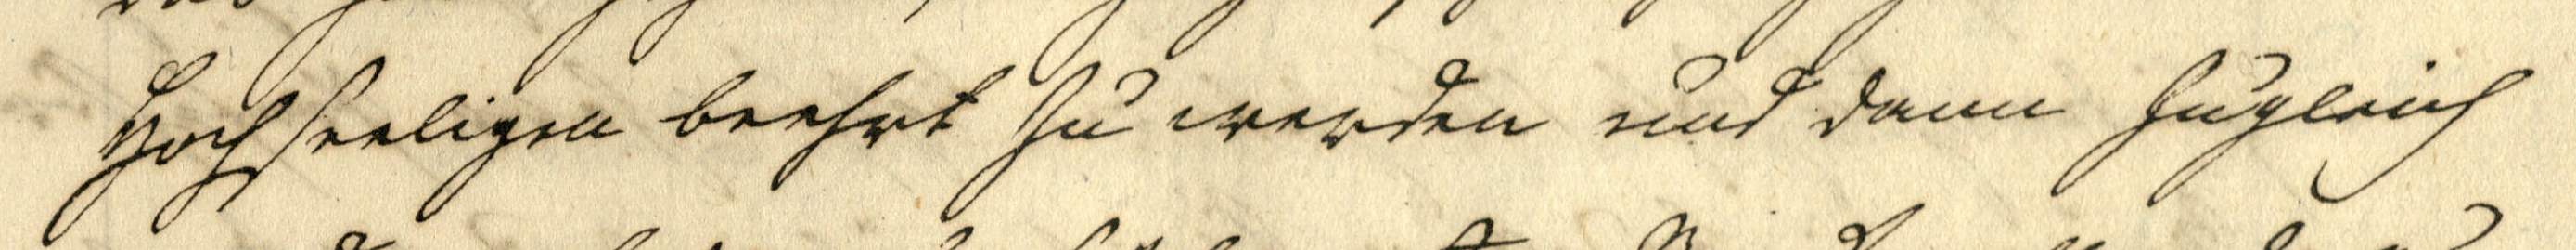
hochseeligen beehrt zu werden und dann zugleich
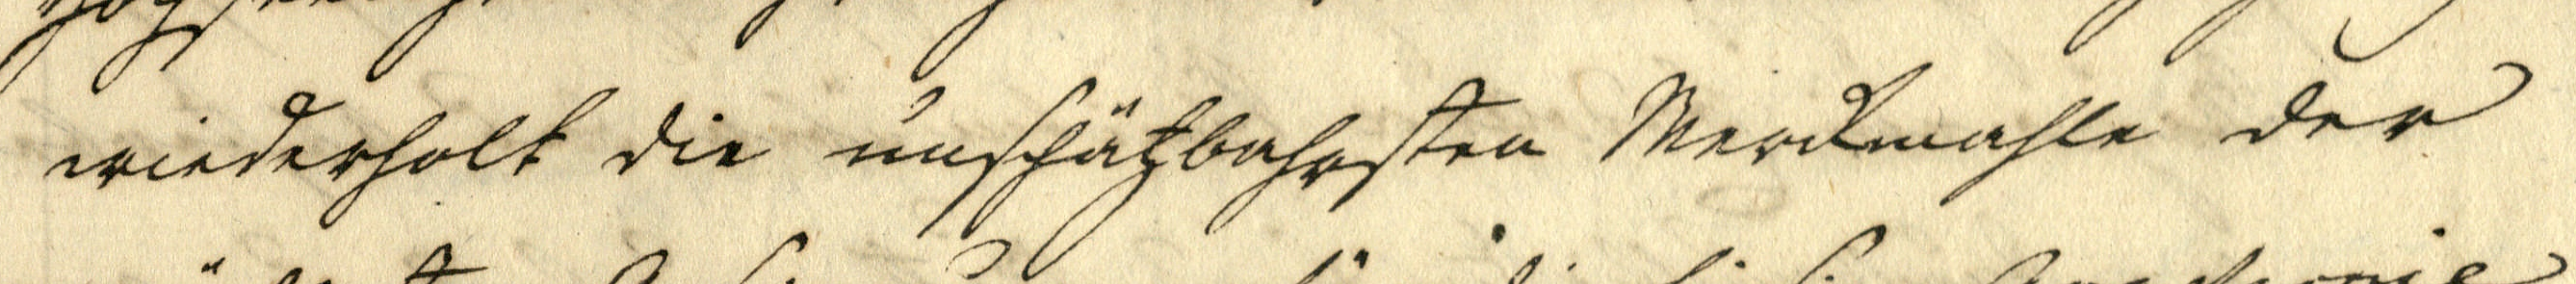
wiederholt die unschätzbahrsten Merkmahle der
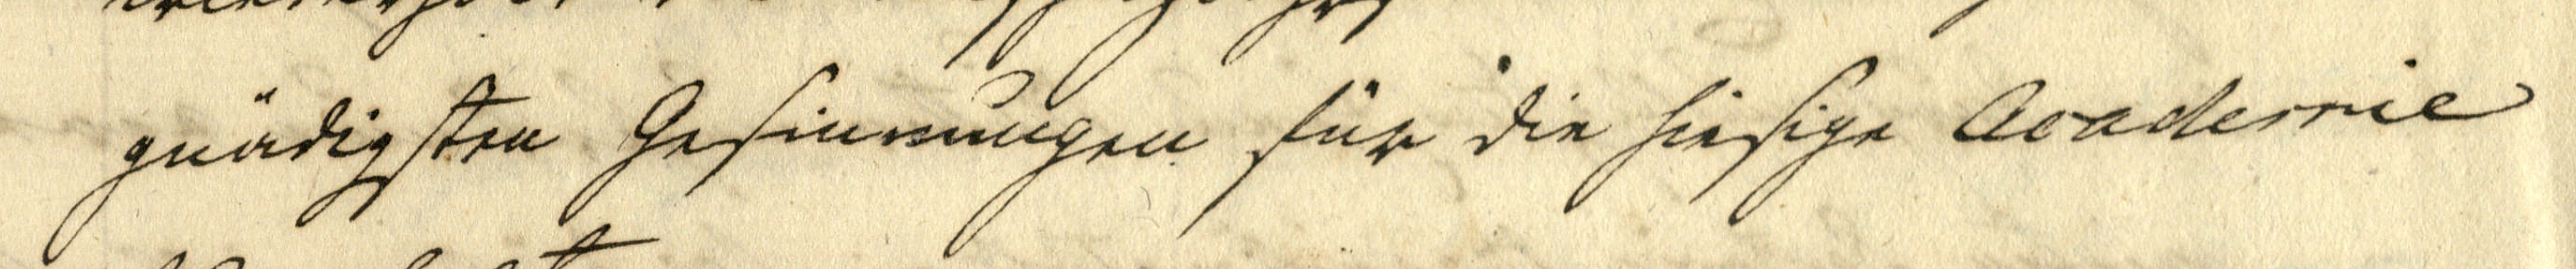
gnädigsten Gesinnungen für die hiesige Academie
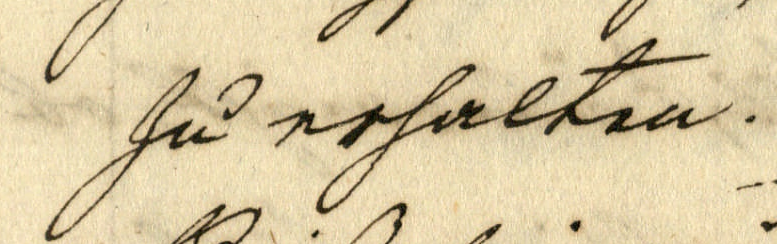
zu erhalten.
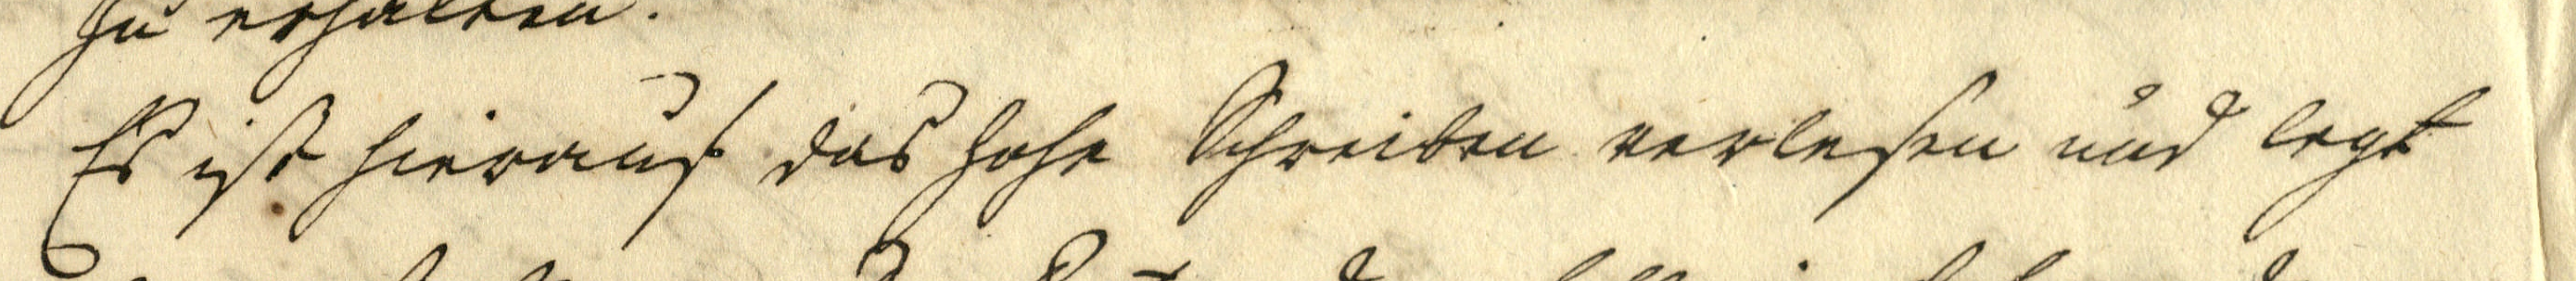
Es ist hierauf das hohe Schreiben verlesen und legt
